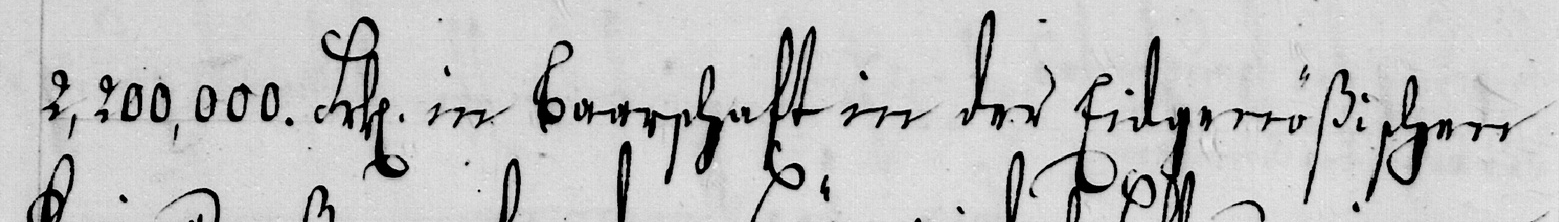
2,200,000. Frk[en] in Baarschaft in der Eidgenößischen
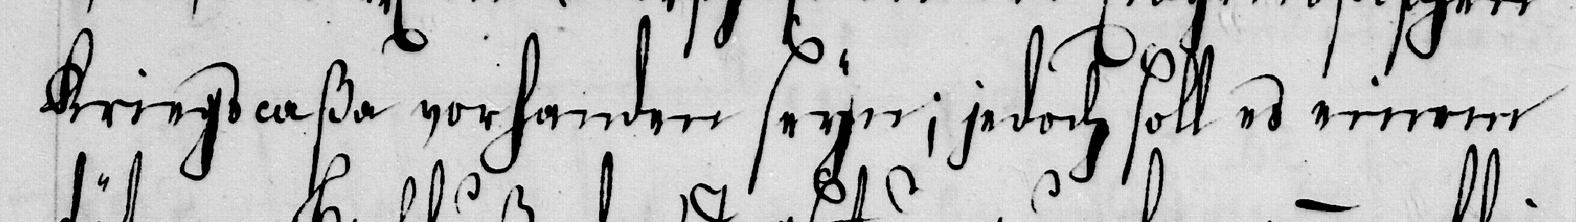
Kriegscaßa vorhanden seyn; jedoch soll es einem
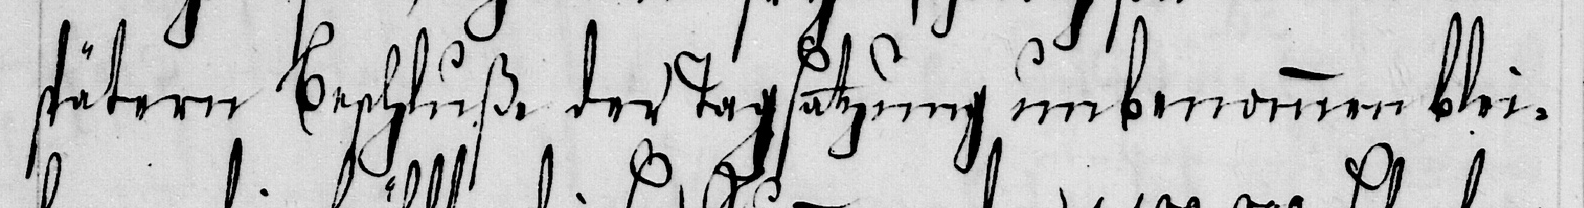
späteren Beschluße der Tagsatzung unbenommen blei¬
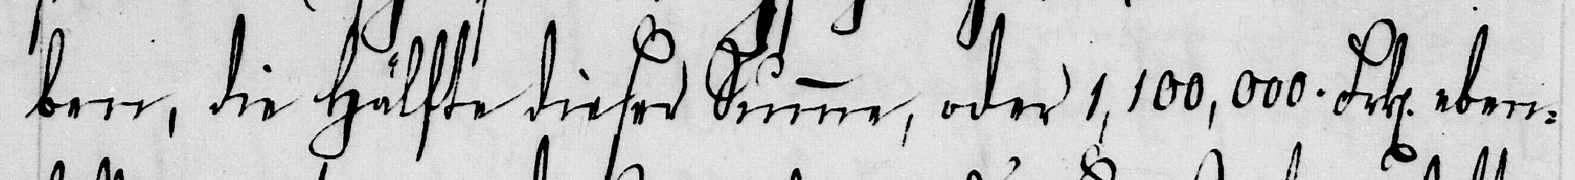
ben, die Hälfte dieser Summe, oder 1,100,000. Frk[en]
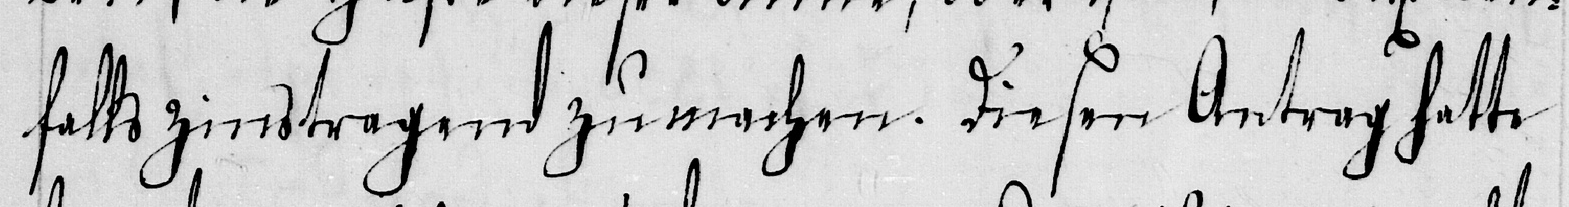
falls zinstragend zu machen. Diesen Antrag hatte
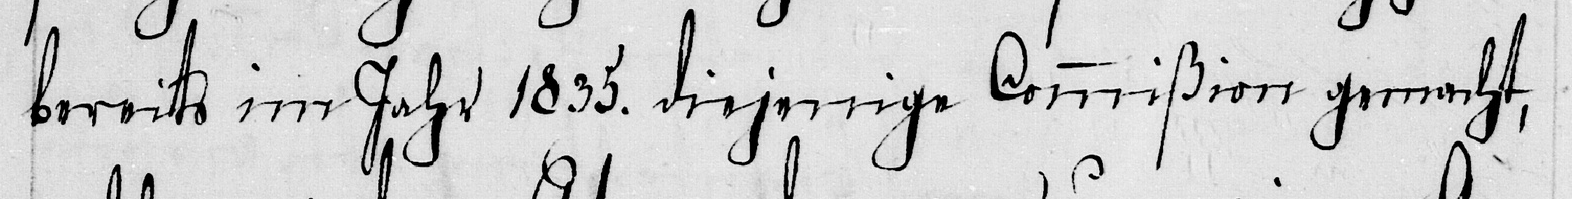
bereits im Jahr 1835. diejenige Commißion gemacht,
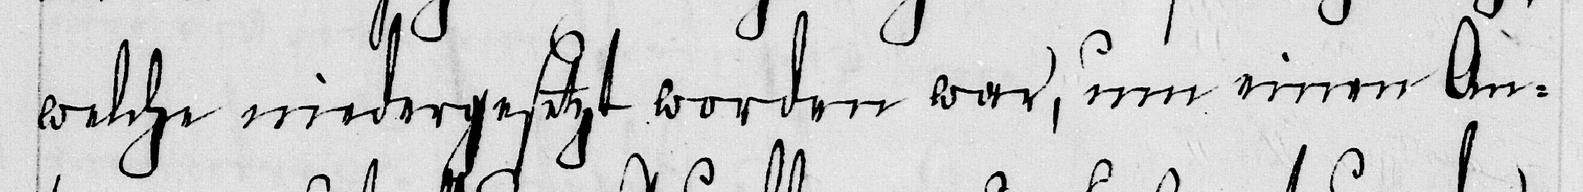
welche niedergesetzt worden war, um einen An¬
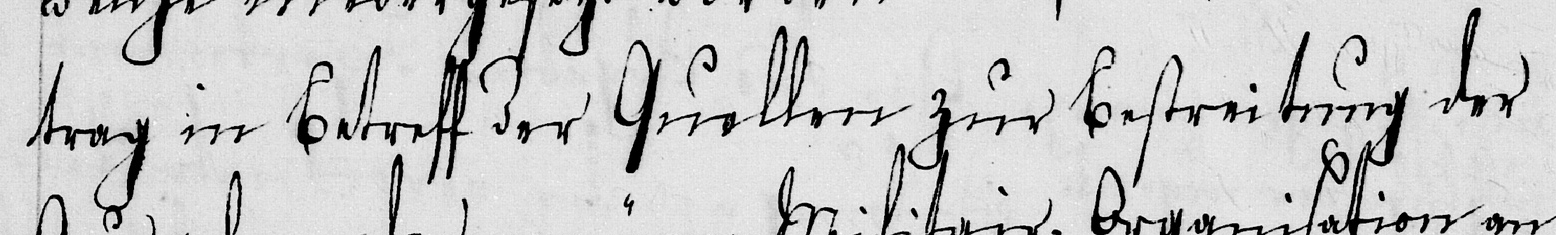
trag in Betreff der Quellen zur Bestreitung der
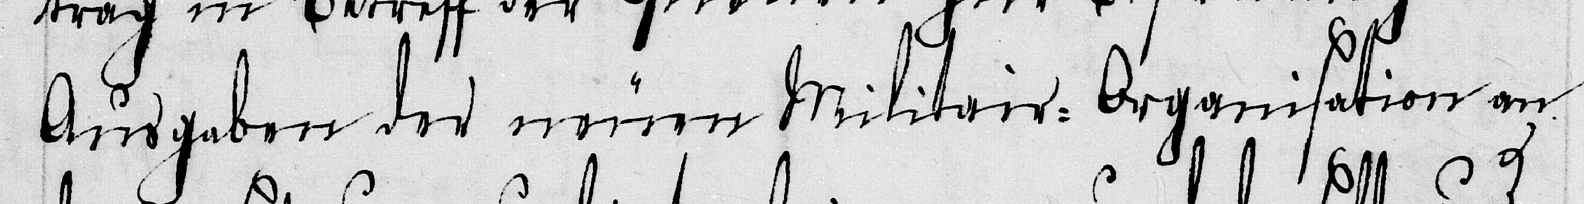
Ausgaben der neuen Militair-Organisation an
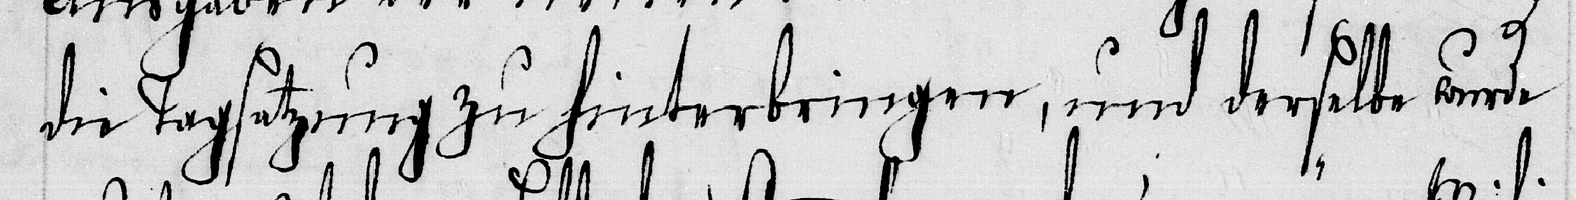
die Tagsatzung zu hinterbringen, und derselbe wurde
